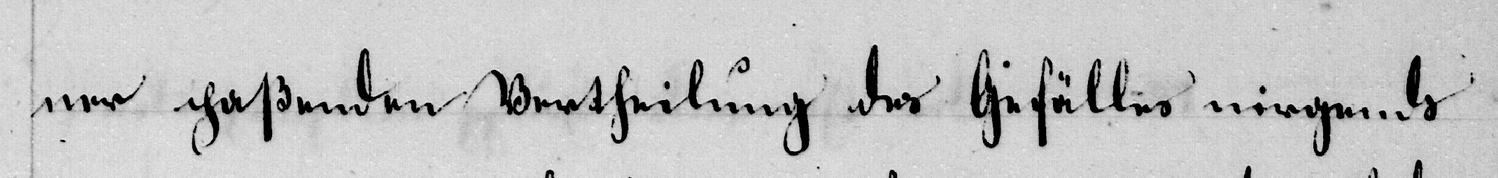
ner paßenden Vertheilung des Gefälles nirgends
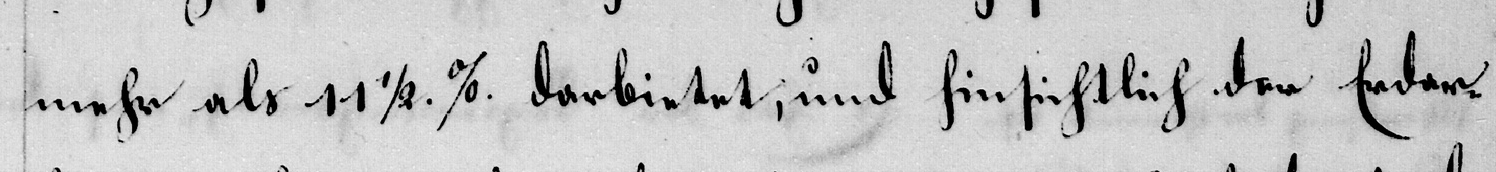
mehr als 111/2.% darbietet, und hinsichtlich der Erdar¬
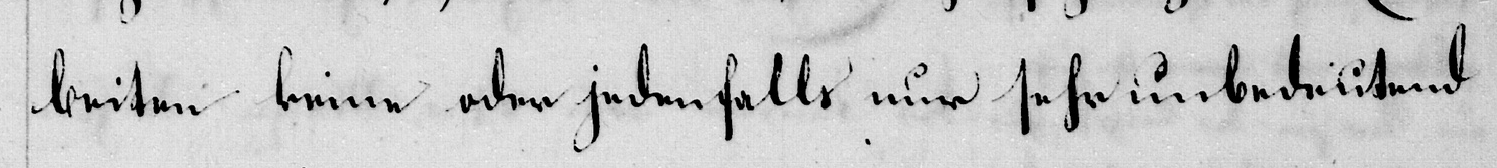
beiten keine oder jedenfalls nur sehr unbedeutend
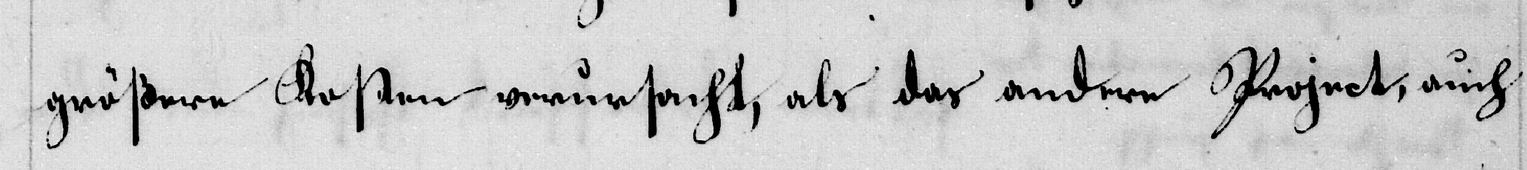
größere Kosten verursacht, als das andere Project, auch
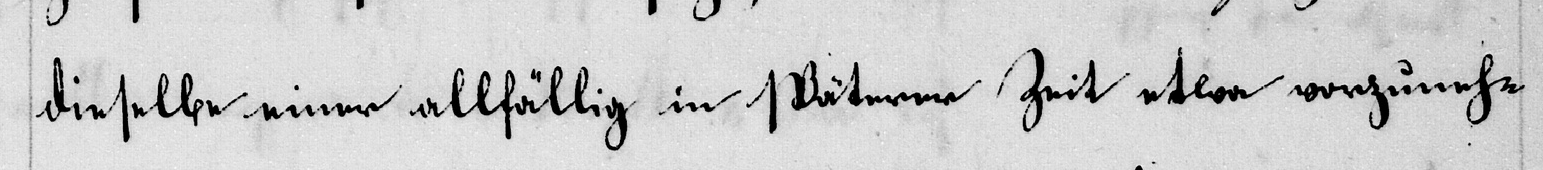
dieselbe einer allfällig in späterer Zeit etwa vorzuneh¬
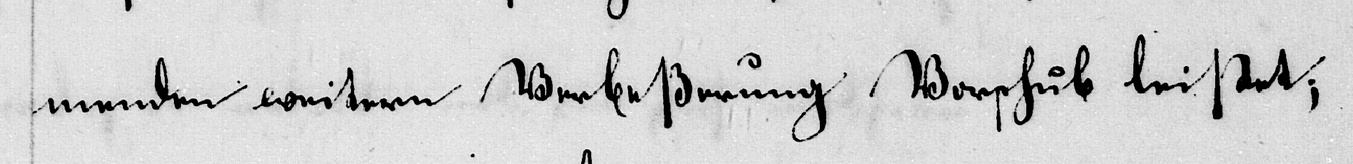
menden weiteren Verbeßerung Vorschub leistet;
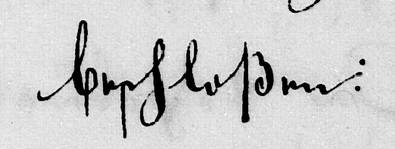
beschloßen:
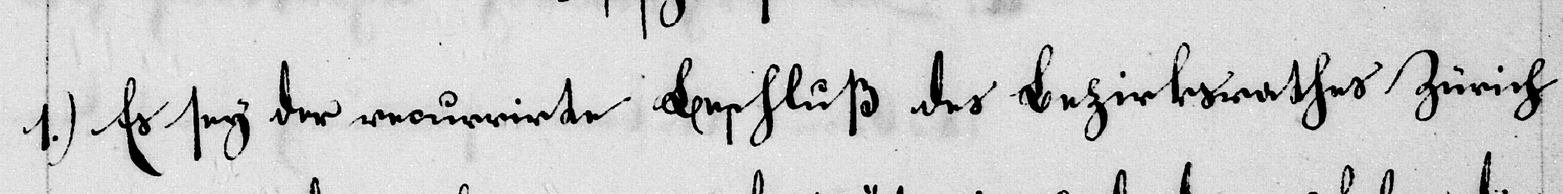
1.) Es sey der recurrirte Beschluß des Bezirksrathes Zürich
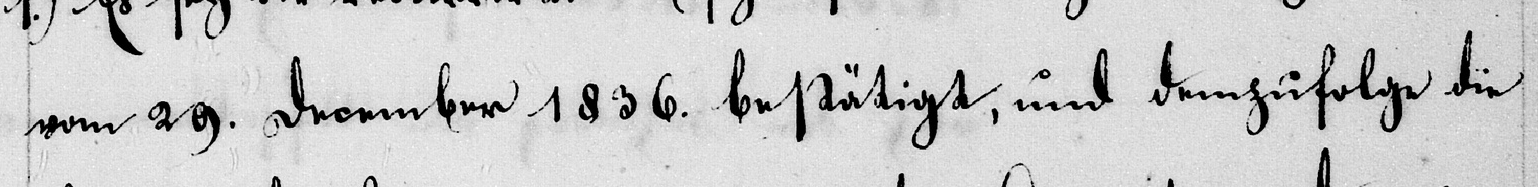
vom 29. December 1836. bestätigt, und demzufolge die
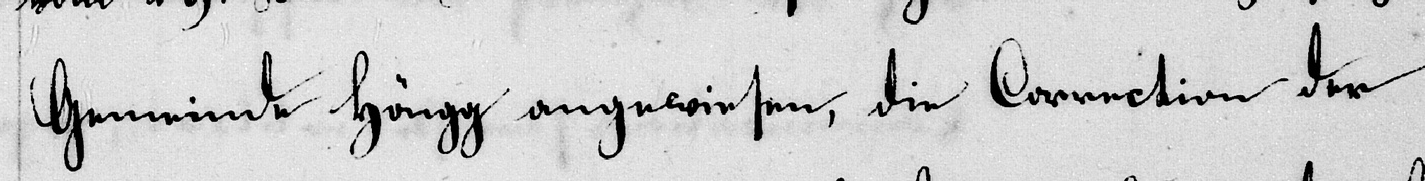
Gemeinde Höngg angewiesen, die Correction der
